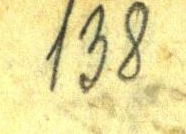138
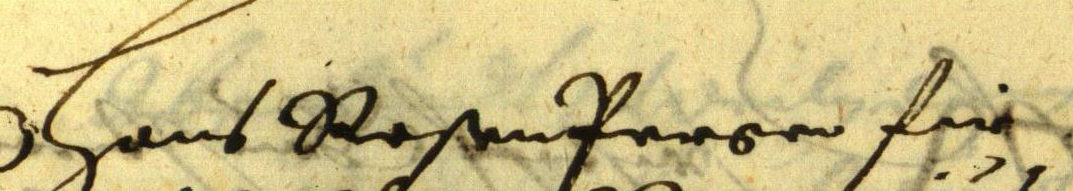Hans ResenPerger fir
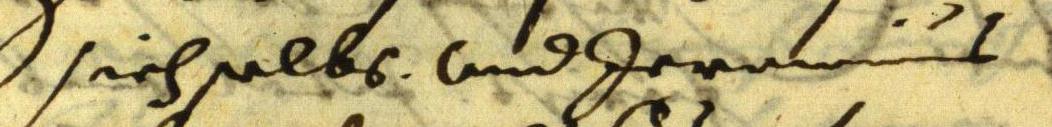sich selbs. vnd Jeronimūs
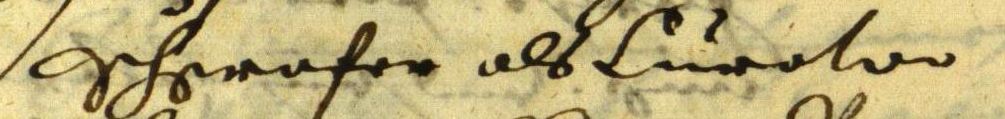Schgrafer als Cūrator
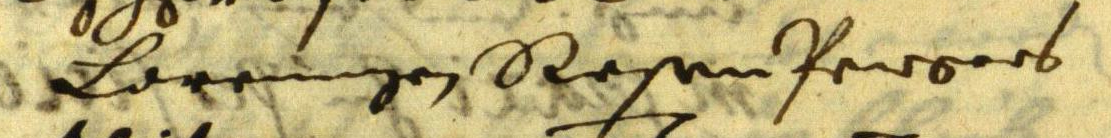Lorennzen ResenPergers
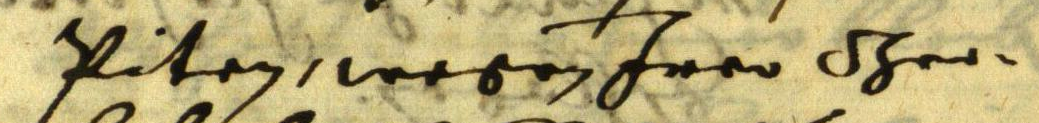Piten, wegen Irer Ger¬
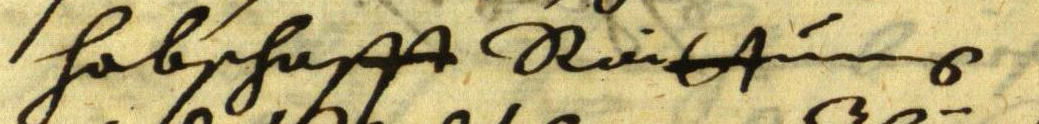habschafft Raittūng
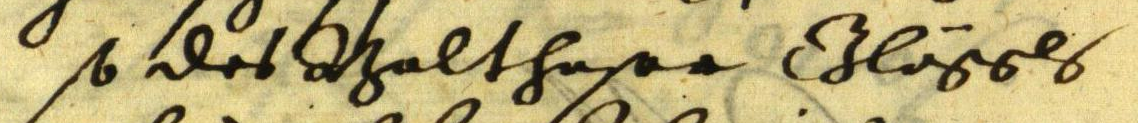so des Balthasar Glöggls
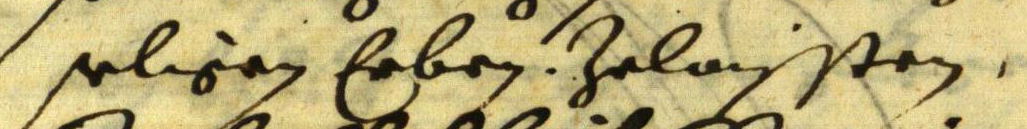seligen Erben. Zelaissten.
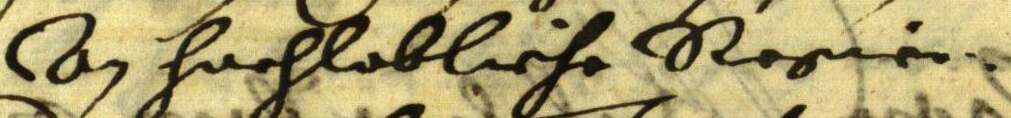An hochlobliche Regier¬
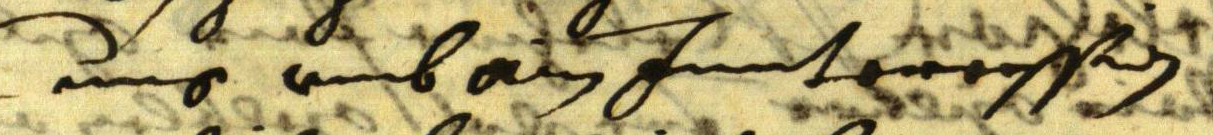ūng vmb ain Inntercession.
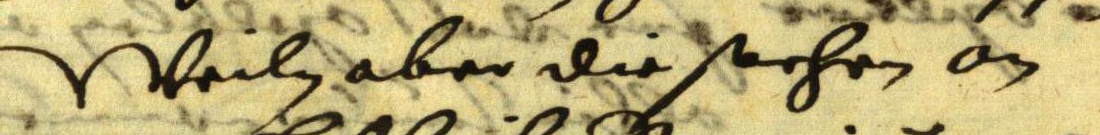Weiln aber die sachen an
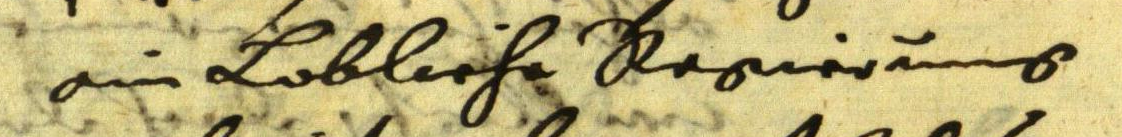ain Lobliche Regierūng
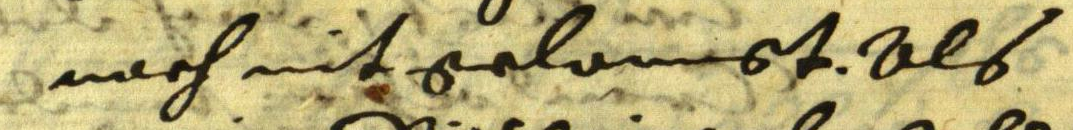noch nit gelanngt. Als
